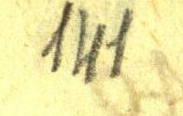141
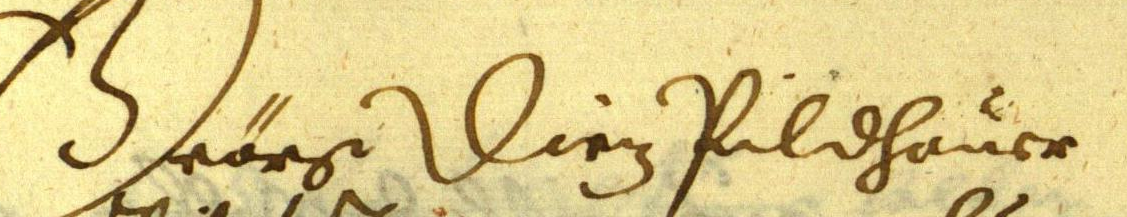Geörg Diez Pildhaūer
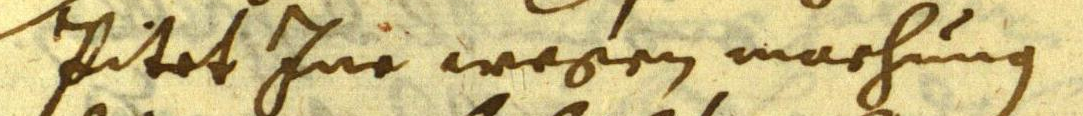Pitet Ine wegen machūng
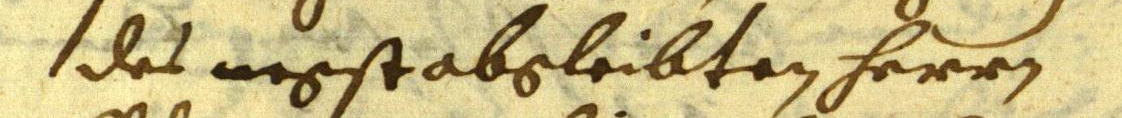des negst abgleibten herrn
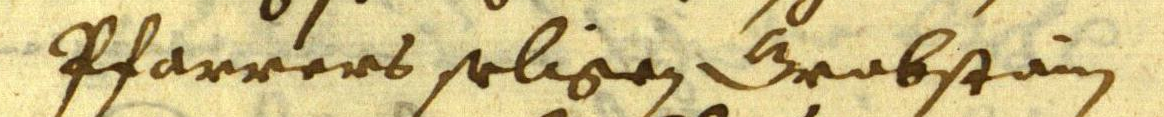Pfarrers seligen Grabstain
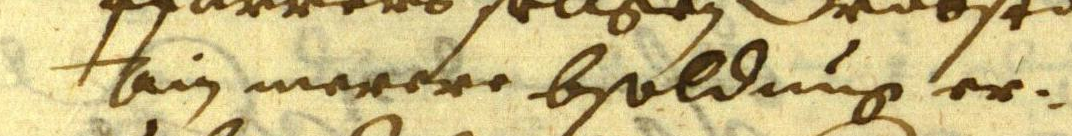Ain merere bsoldūng er¬
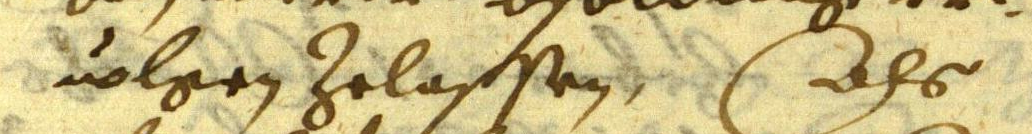ūolgen Zelassen, Als
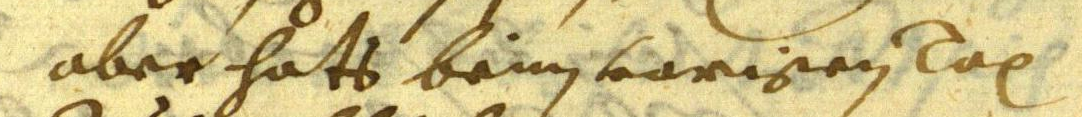aber hats beim vorigen Tax
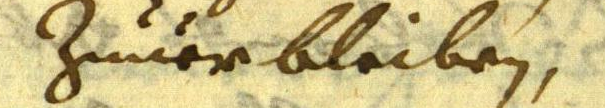Zūūerbleiben,
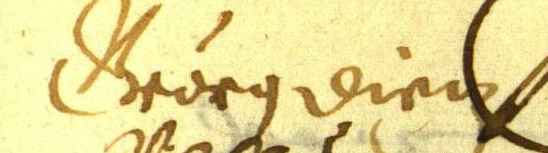Geōrg diez
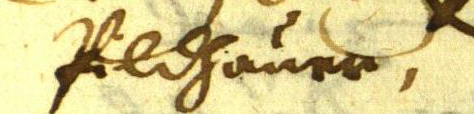Pildhaūer,
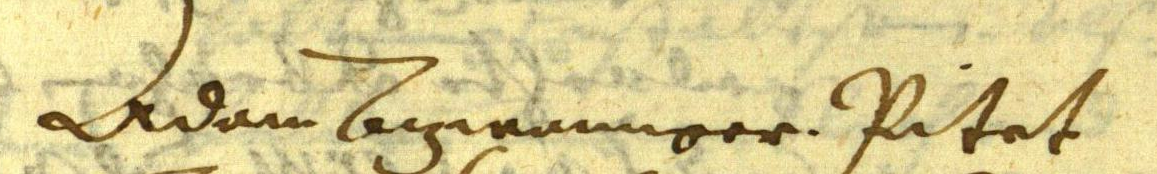Adam Azwannger. Pitet
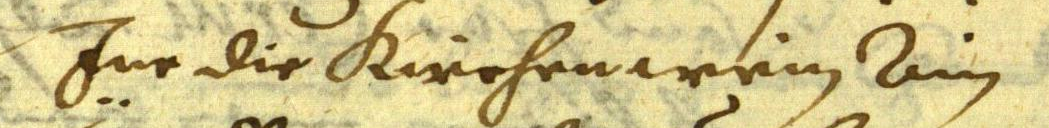Ine die Kirchenwein Ain
